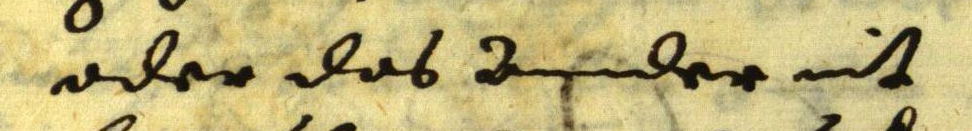oder das Annder nit
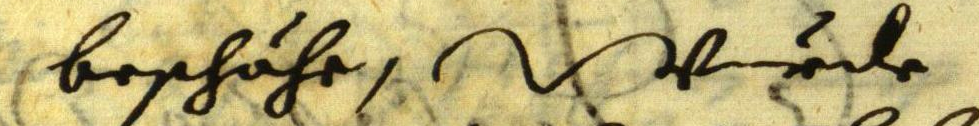beschāhe, Wūrde
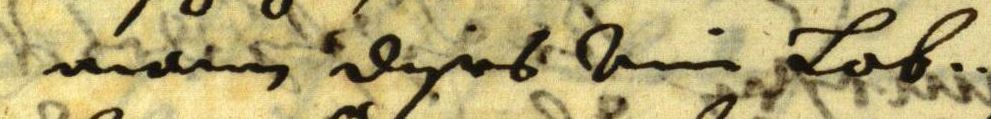mann dises Ain Lob¬
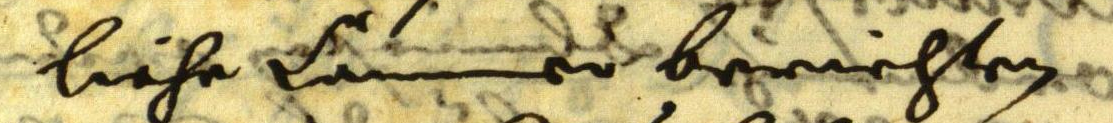liche Cammer berichten
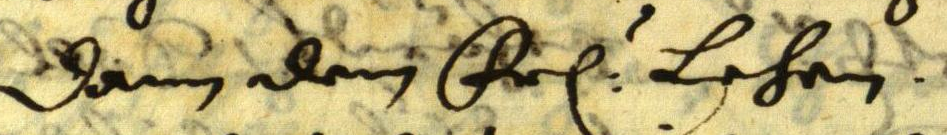dann dem Frl: Lehen.
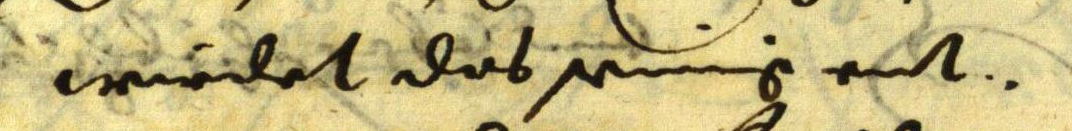wirdet das seinig ent¬
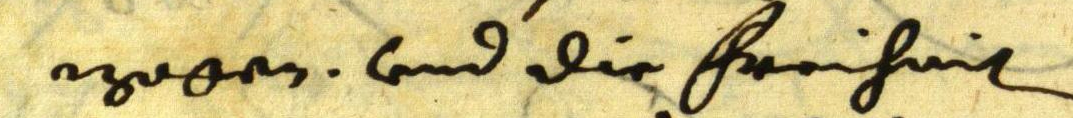zogen. vnd die Freihait
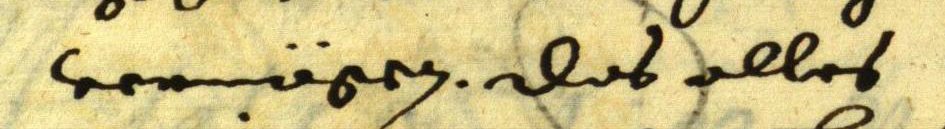vermögen. das alles
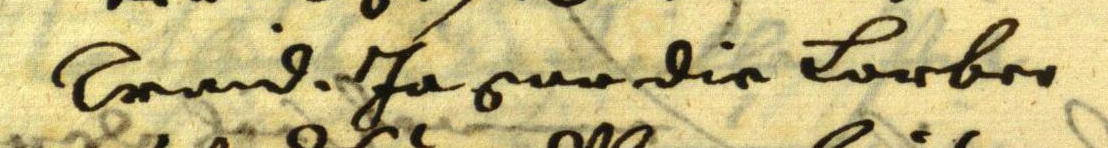Traid. Ja gar die Lorber
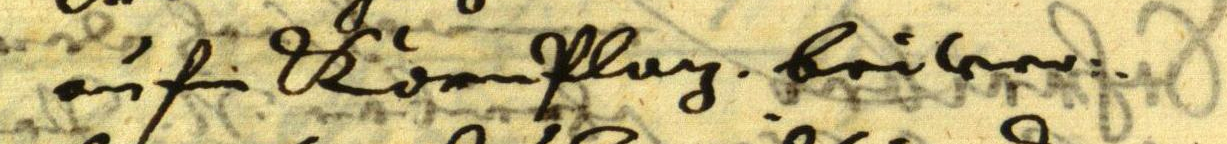aūfm KornPlaz. bei ver¬
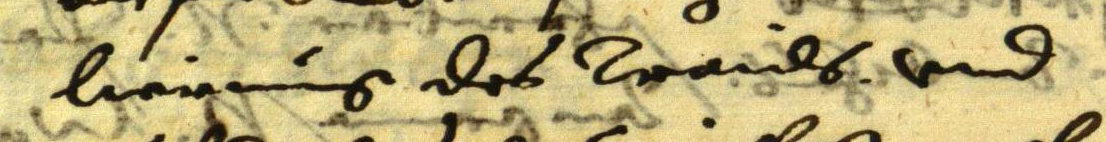lierūng des Traids. vnd
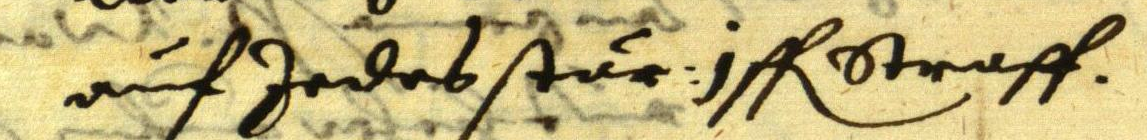aūf Jedes stār: 1 fl Straff.
